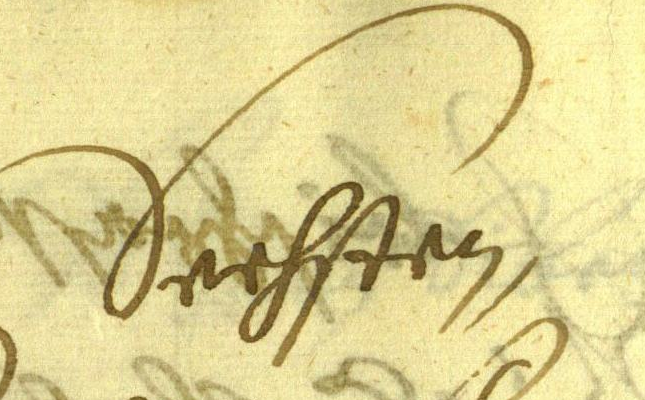Sechsten,
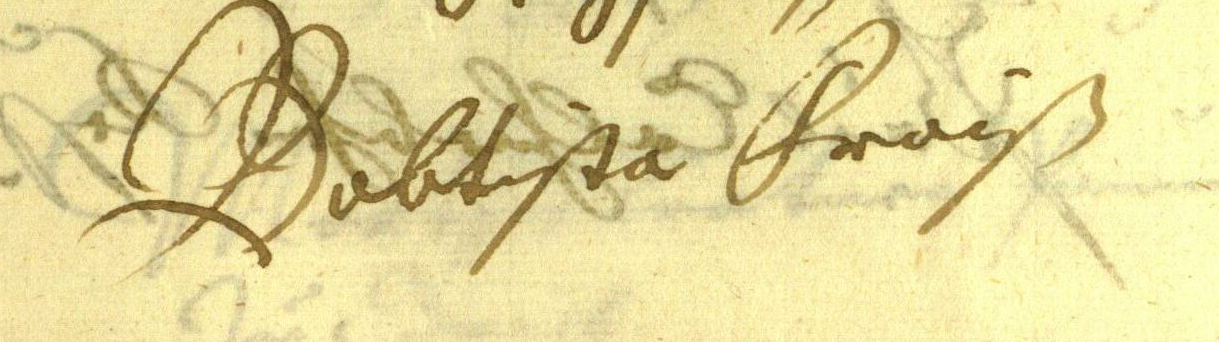Babtista Fraiß
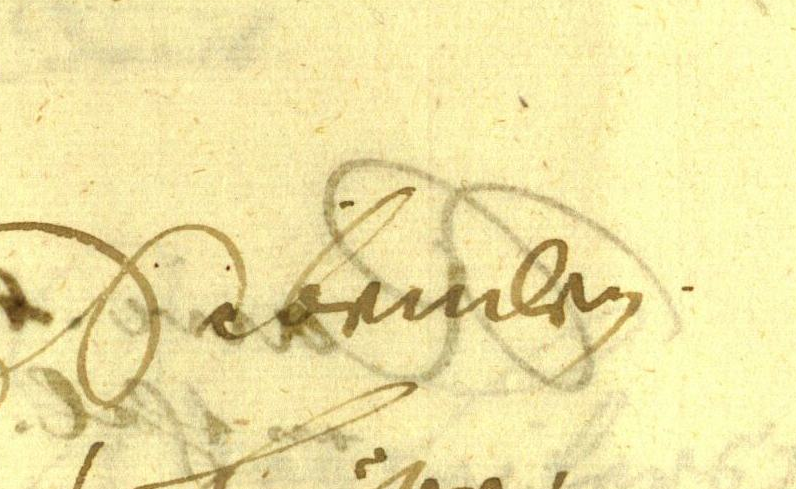Sibenden.
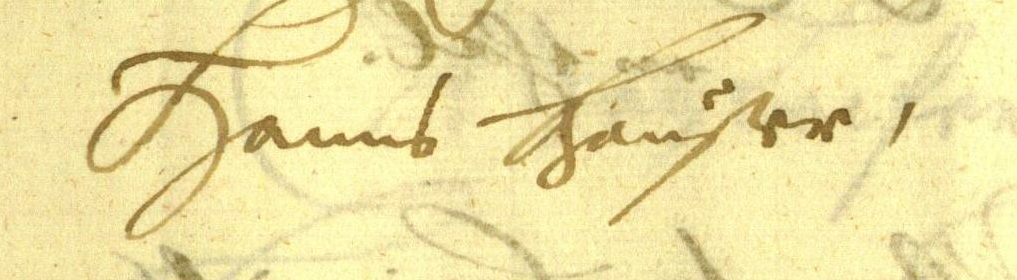Hanns Haūser,
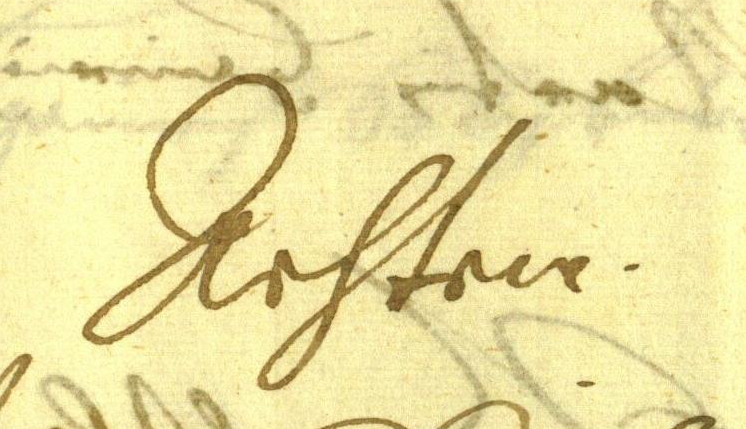Achten.
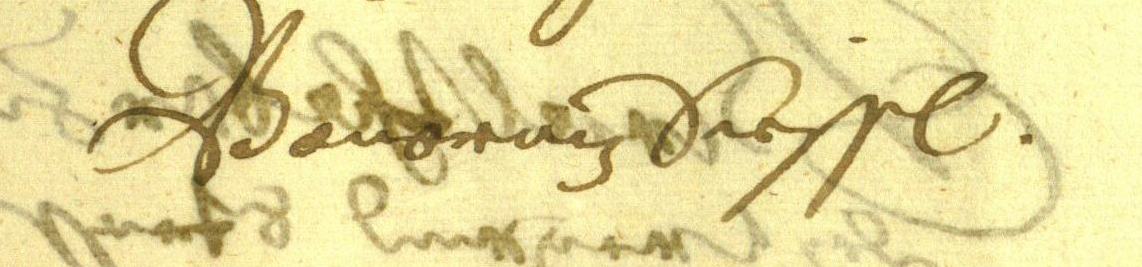Bangratz Siessl.
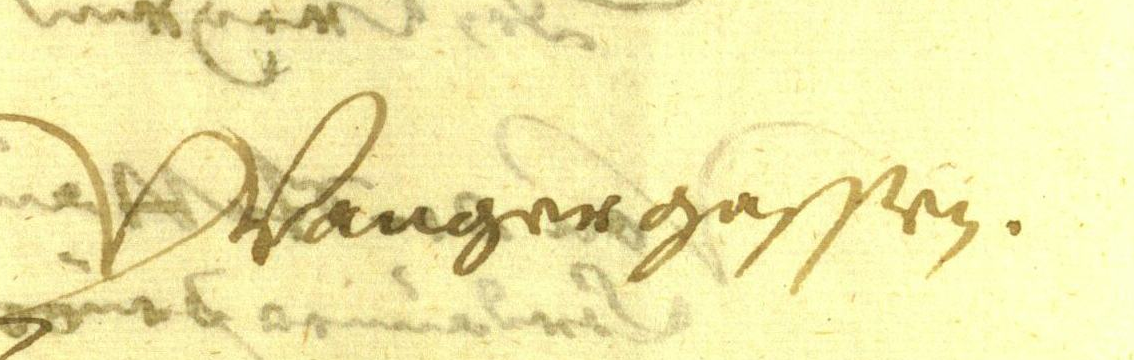Wangergassen.
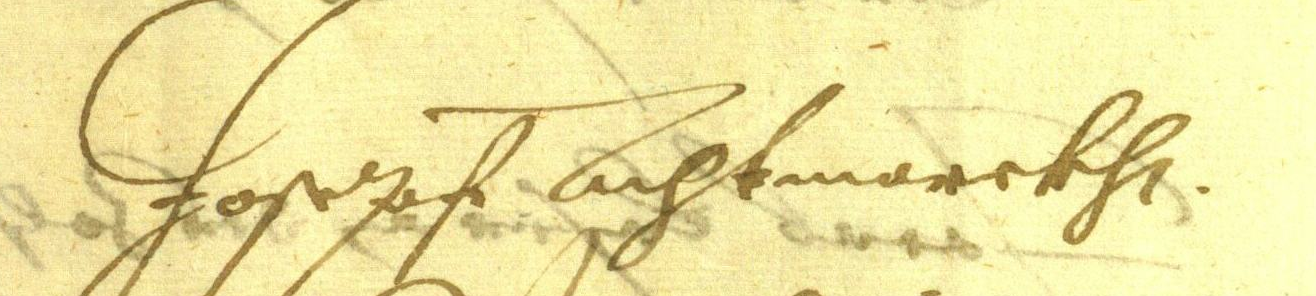Josepf Achtmarckht.
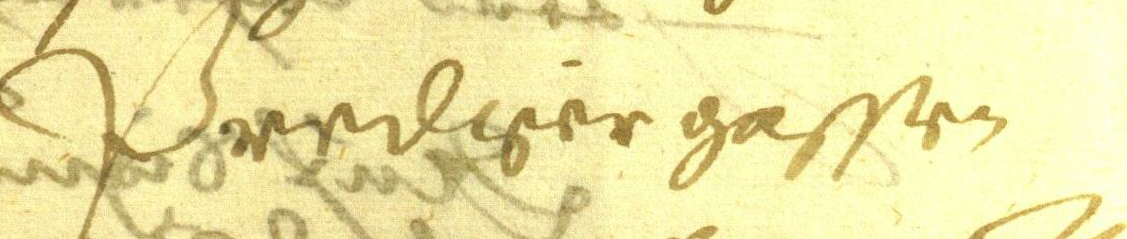Predigergassen
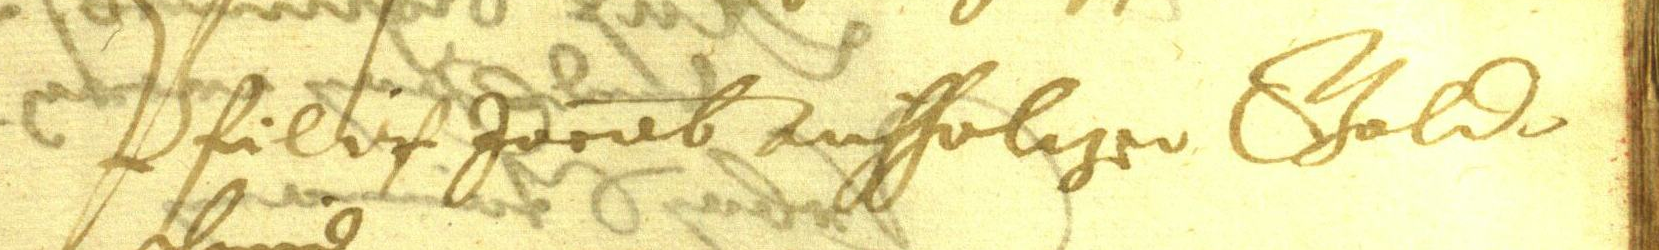Pfilip Jacob Aūfholzer Gold¬
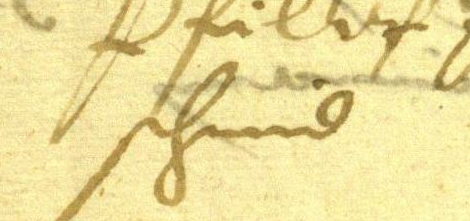schmid
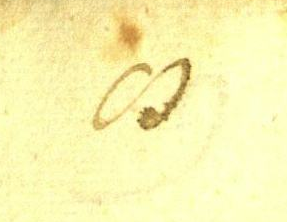8
